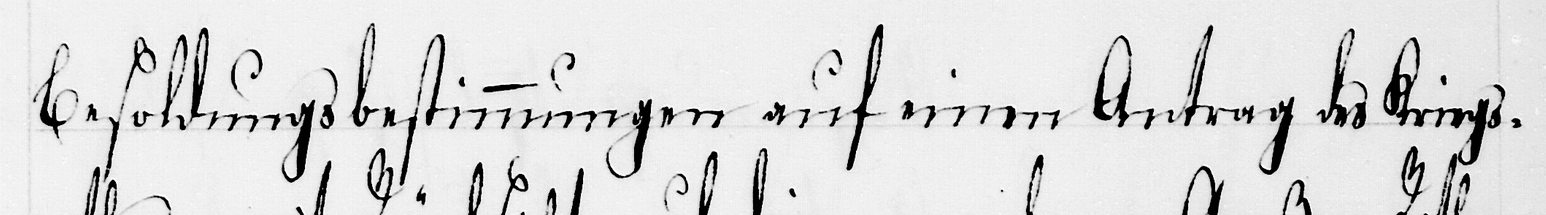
Besoldungsbestimmungen auf einen Antrag des Krieg¬
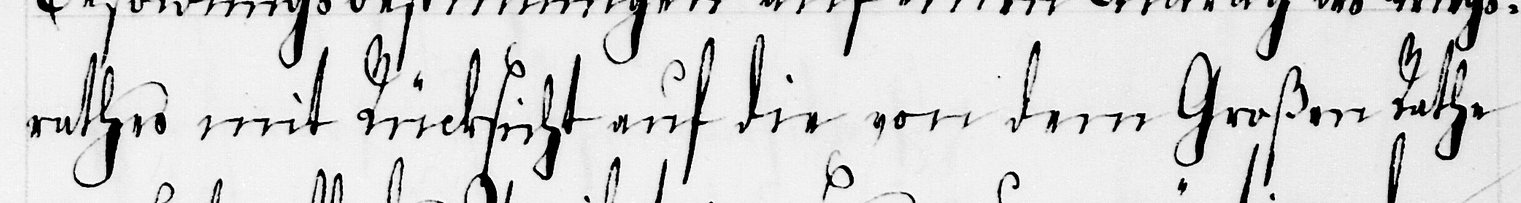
rathes mit Rücksicht auf die von dem Großen Rathe
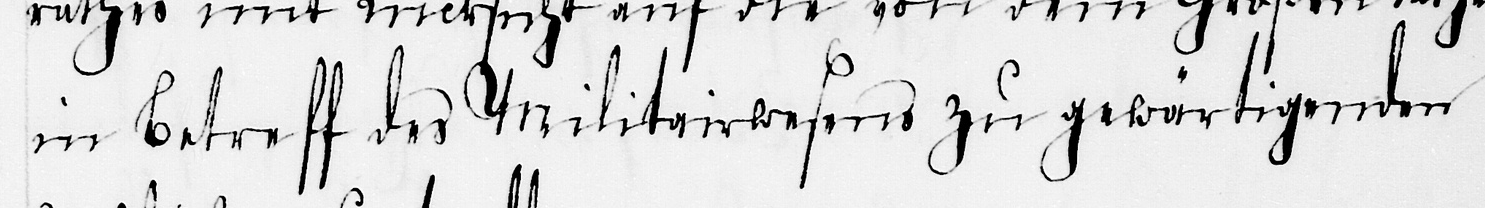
in Betreff des Militairwesens zu gewärtigenden
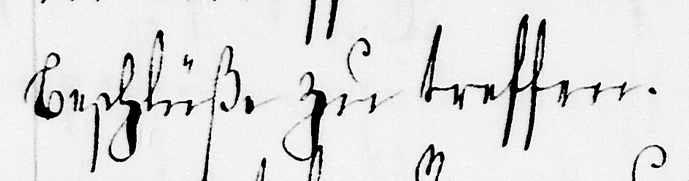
Beschlüße zu treffen.
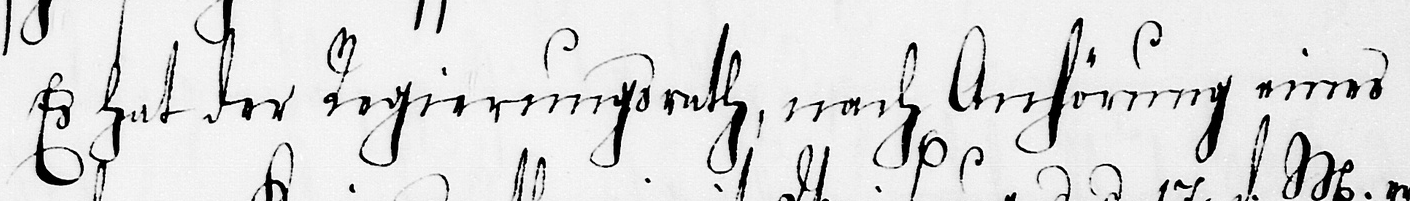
Es hat der Regierungsrath, nach Anhörung eines
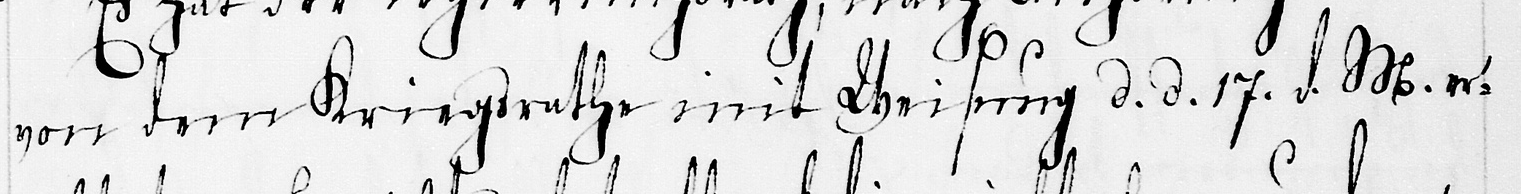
von dem Kriegsrathe mit Weisung d. d. 17. d. M. ers¬
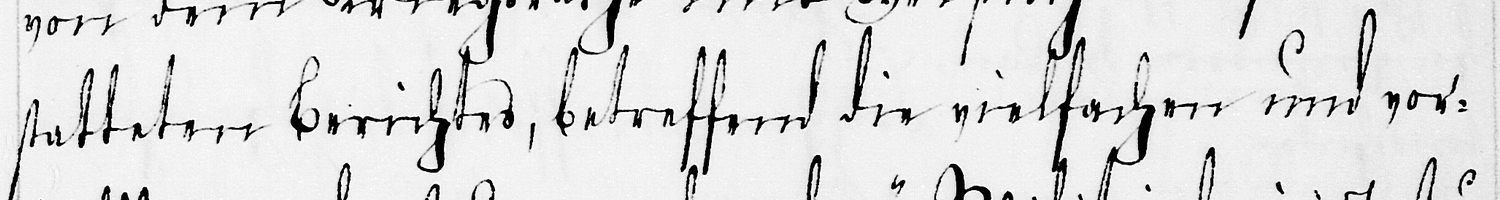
tatteten Berichtes, betreffend die vielfachen und vor¬
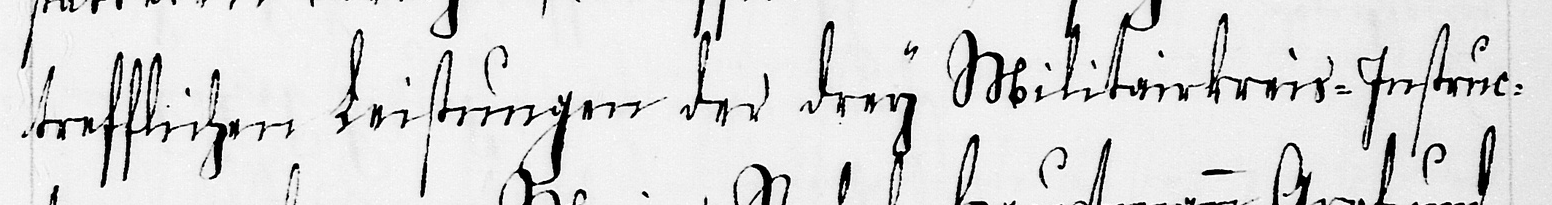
trefflichen Leistungen der drey Militairkreis-Instruc¬
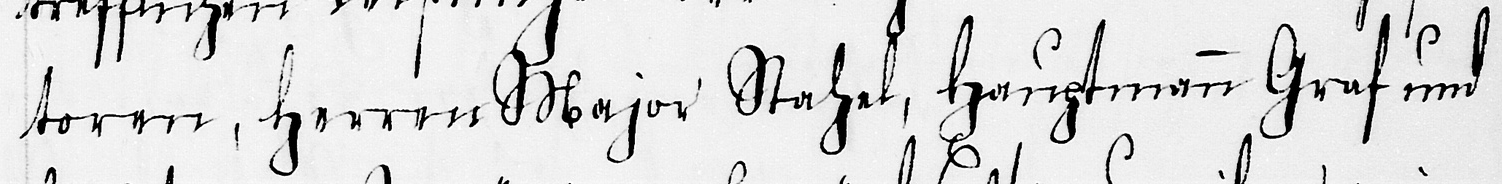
toren, Herren Major Stahel, Hauptmann Graf und
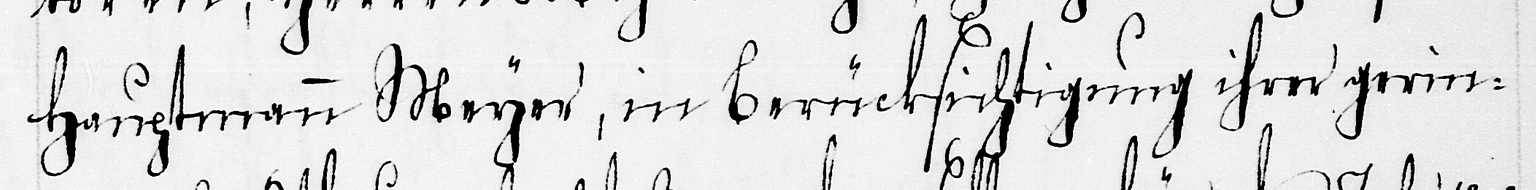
Hauptmann Meyer, in Berücksichtigung ihrer gerin¬
